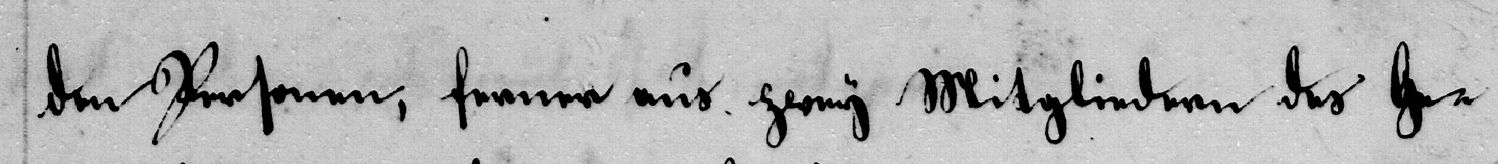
den Personen, ferner aus zwey Mitgliedern des Ge¬
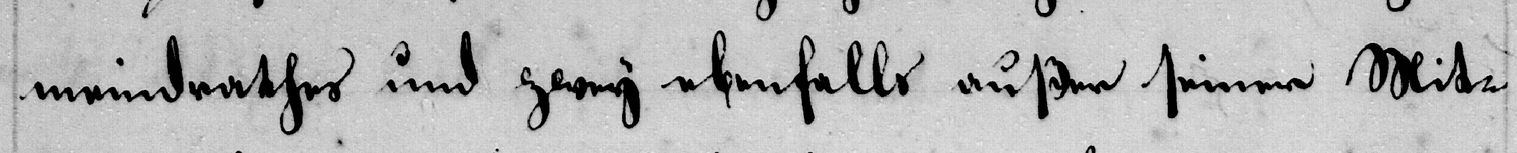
meindrathes und zwey ebenfalls außer seiner Mit¬
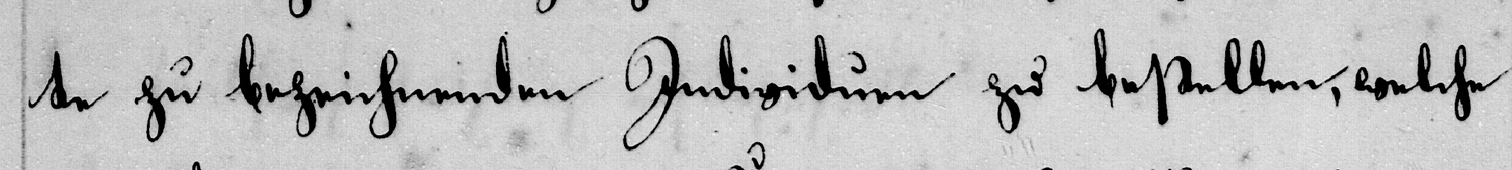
te zu bezeichnenden Individuen zu bestellen, welche
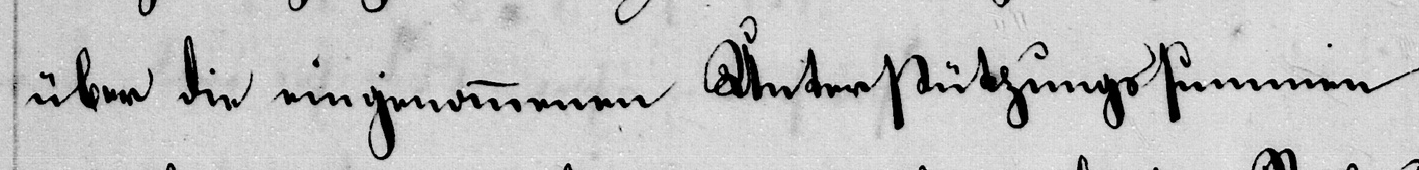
über die eingenommenen Unterstützungssummen
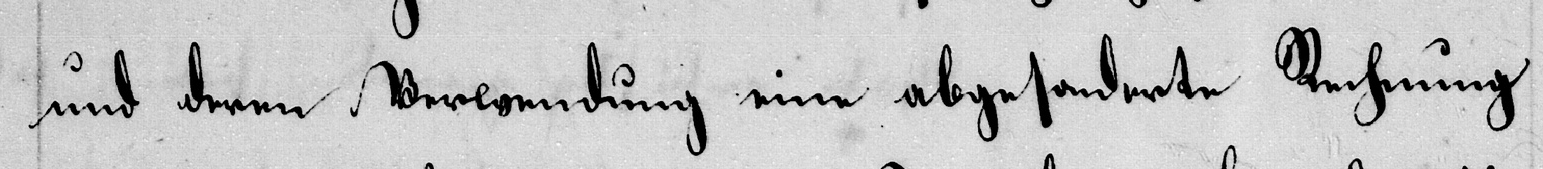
und deren Verwendung eine abgesonderte Rechnung
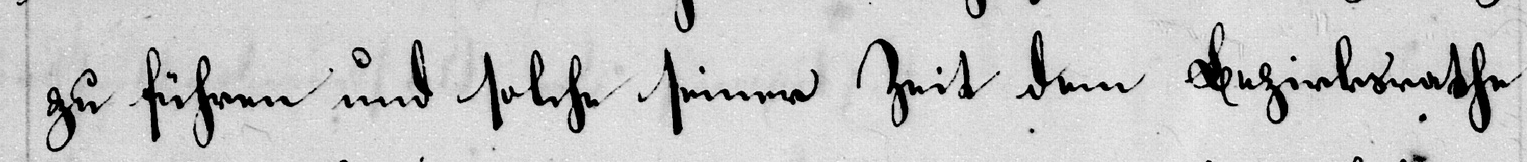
zu führen und solche seiner Zeit dem Bezirksrathe
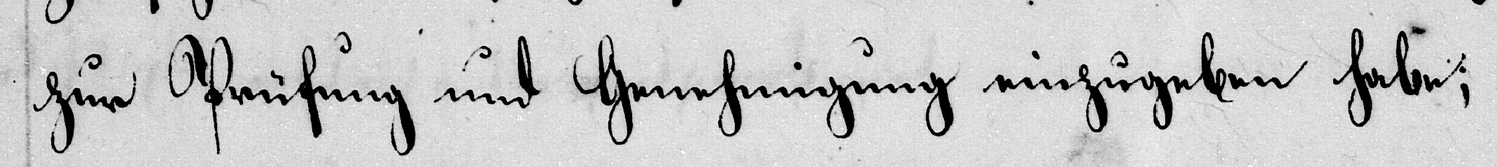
zur Prüfung und Genehmigung einzugeben habe;
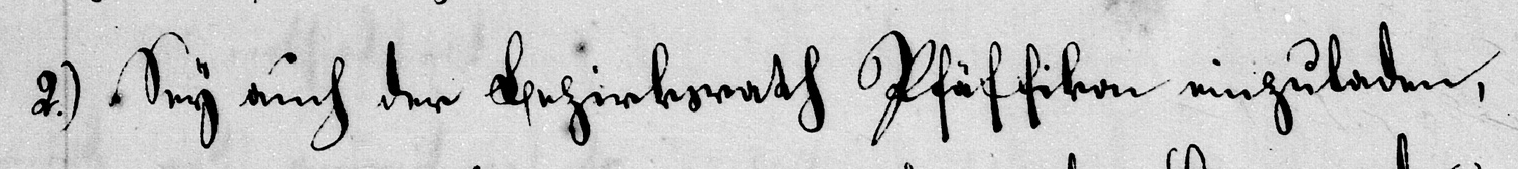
2.) Sey auch der Bezirksrath Pfäffikon einzuladen,
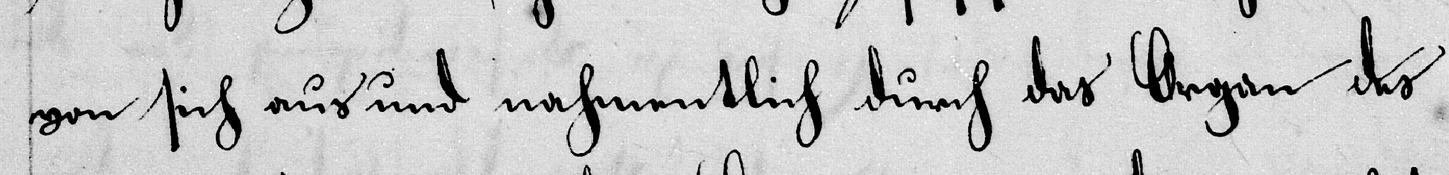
von sich aus und nahmentlich durch das Organ des
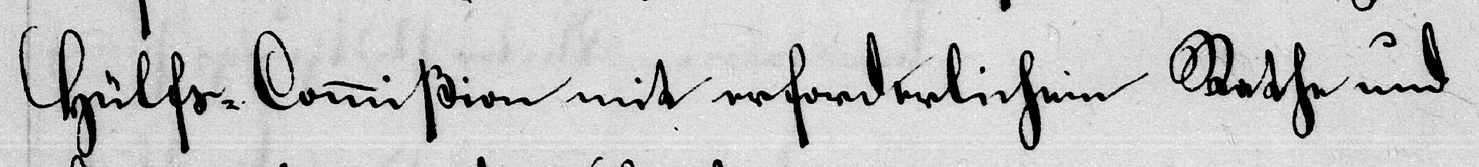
Hülfs-Commißion mit erforderlichem Rathe und
